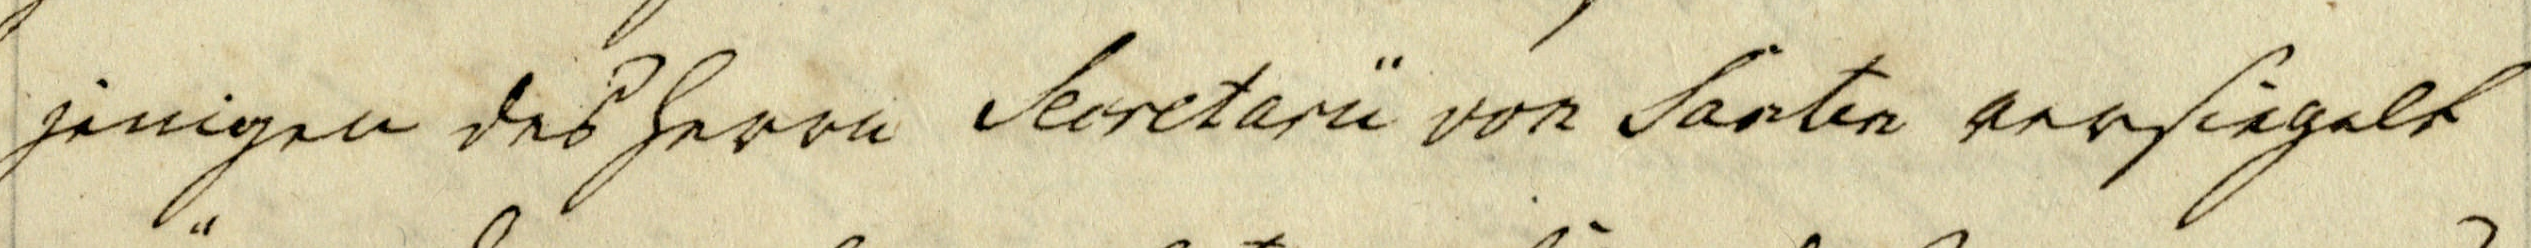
jenigen des Herrn Secretarii von Santen versiegelt
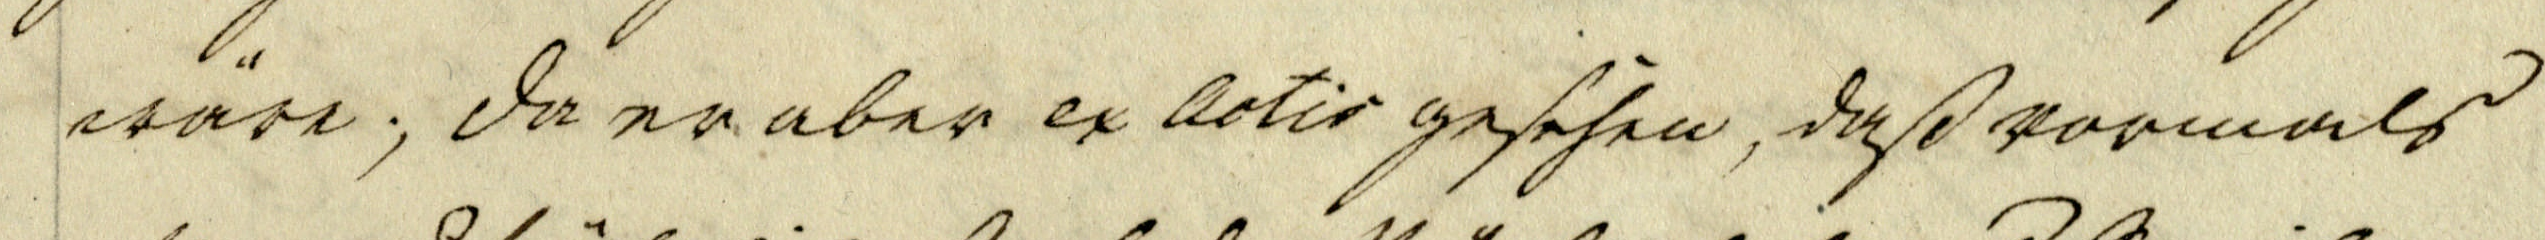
wäre., Da er aber ex Actis gesehen, daß vormals
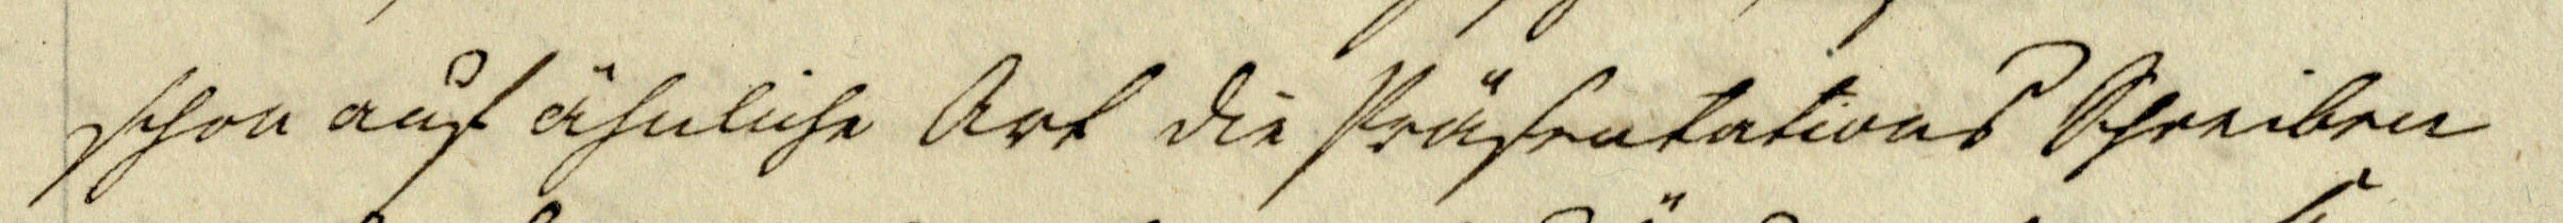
schon auf ähnlichen Art die Präsentations Schreiben
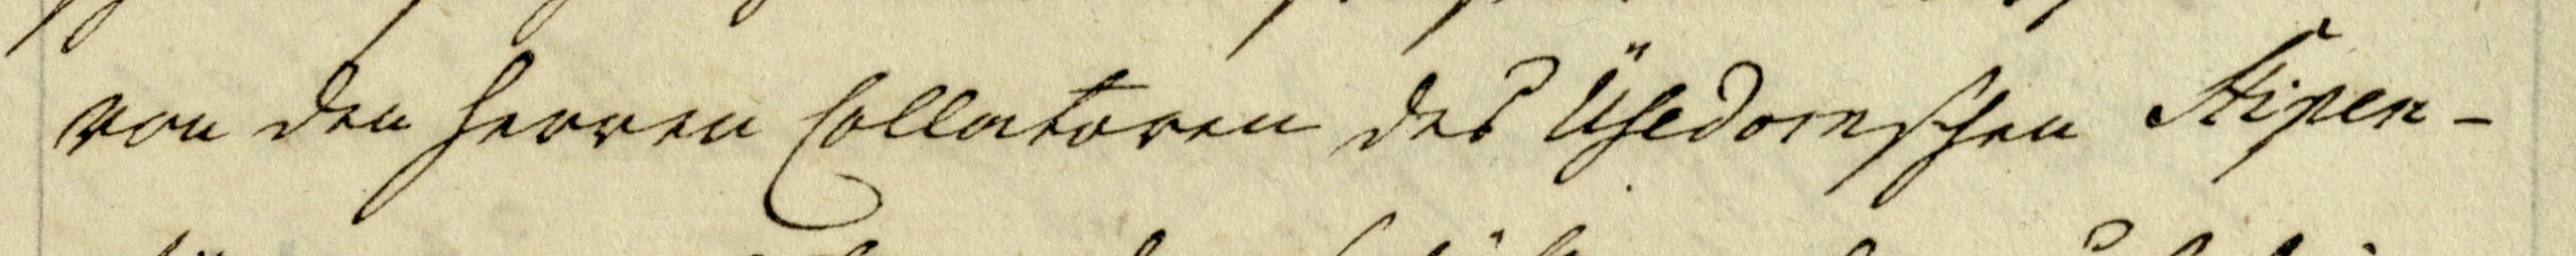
von den Herren Collatoren des Üsedomschen Stipen¬
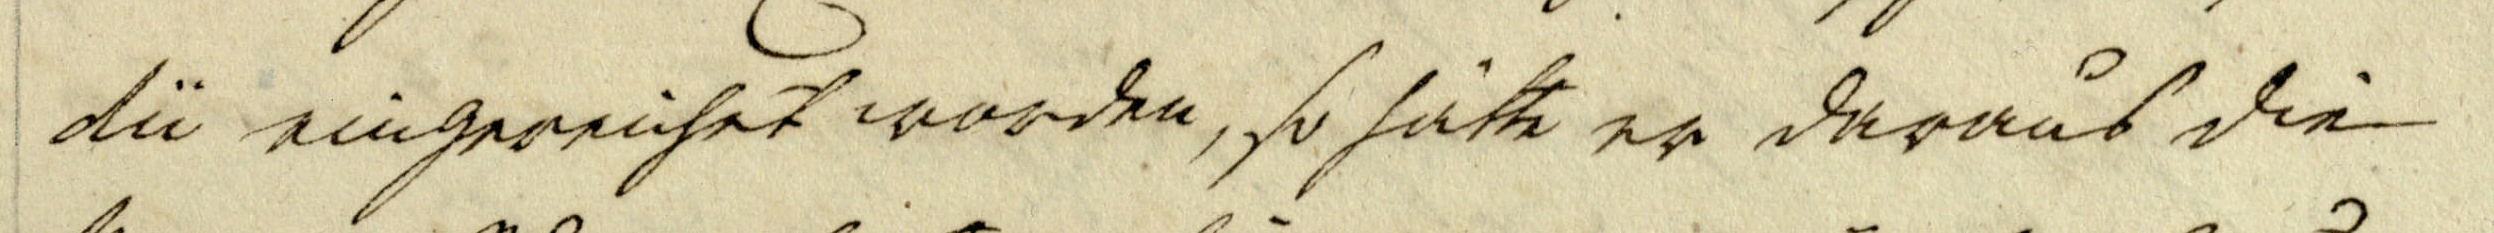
dii eingereichet worden, so hätte er daraus die
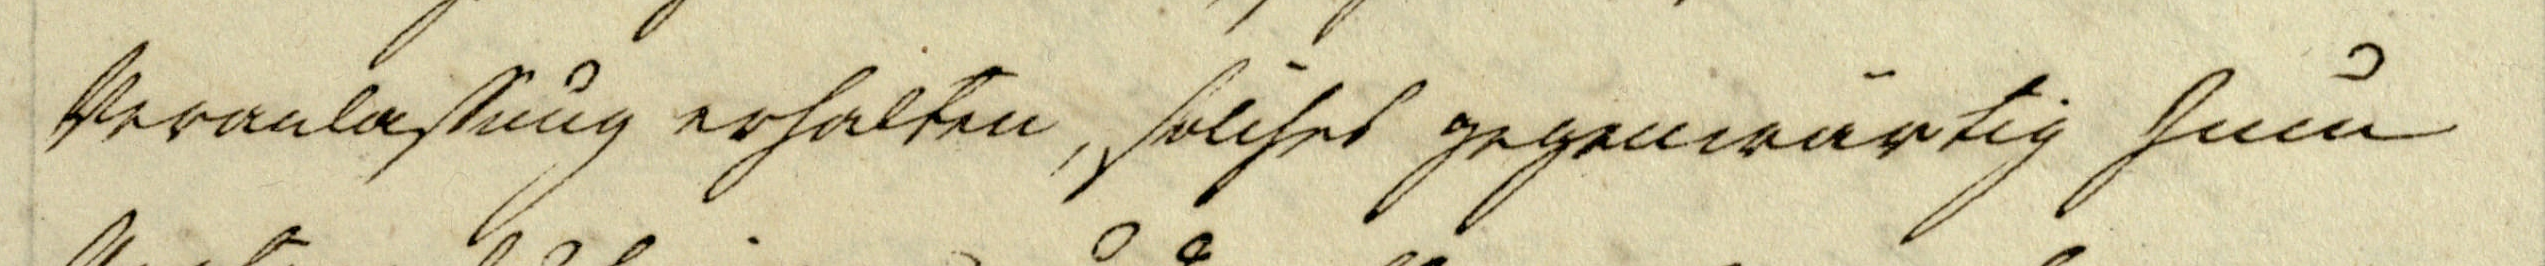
Veranlassung erhalten, solches gegenwärtig zum
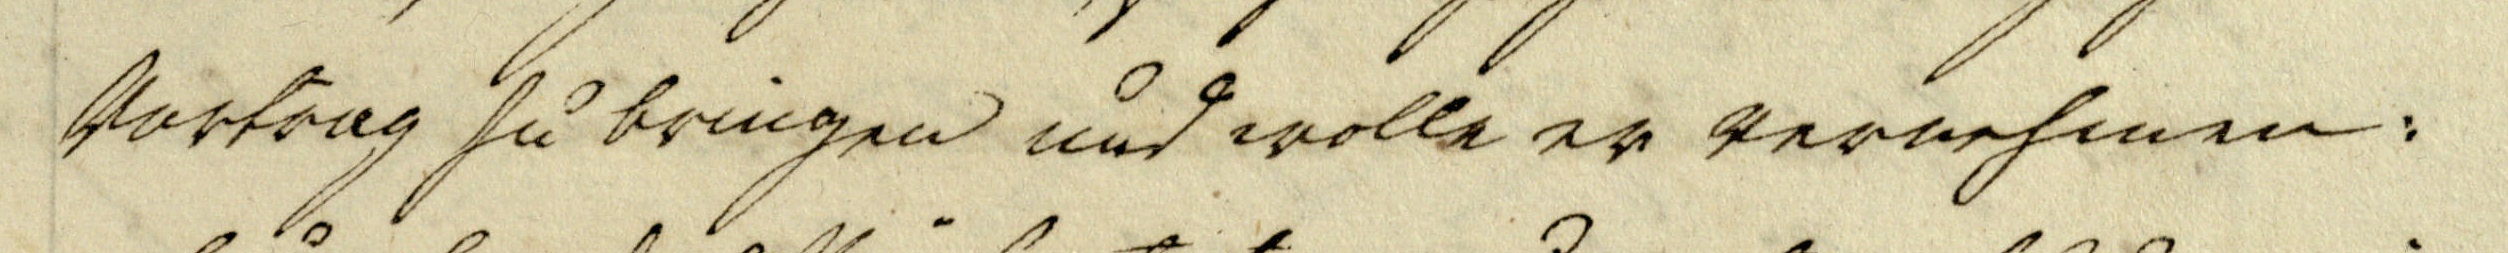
Vortrag zu bringen und wolle er vernehmen:
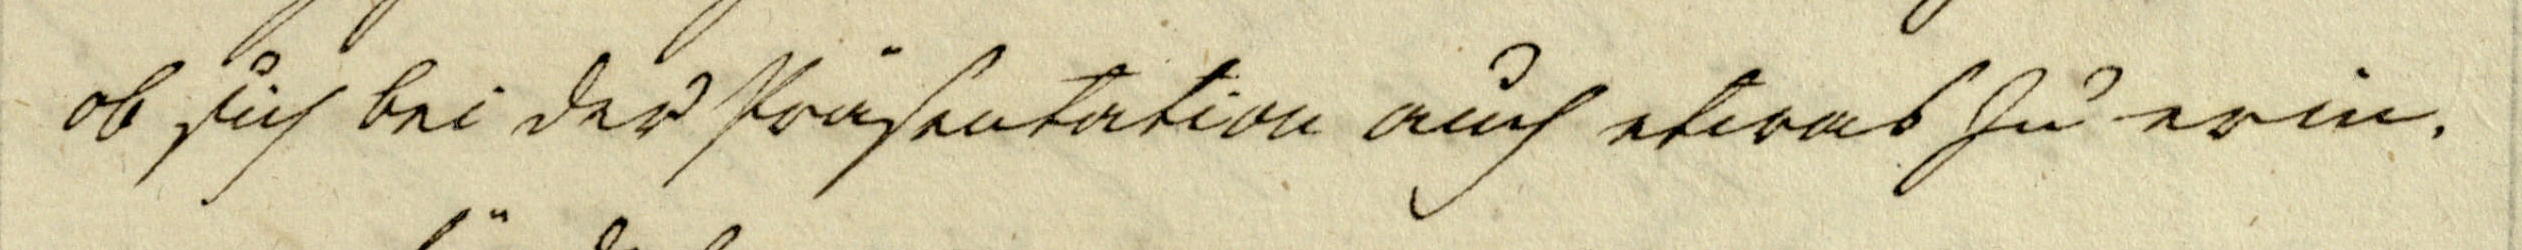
ob sich bei der Präsentation auch etwas zu erin¬
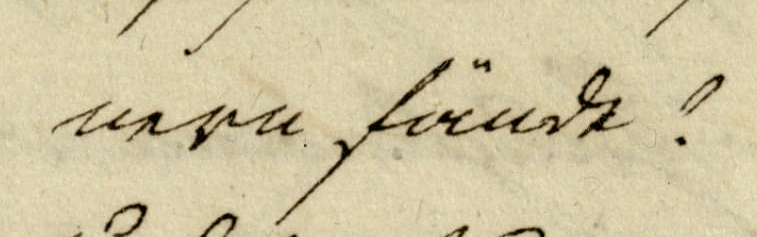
nern fände ?
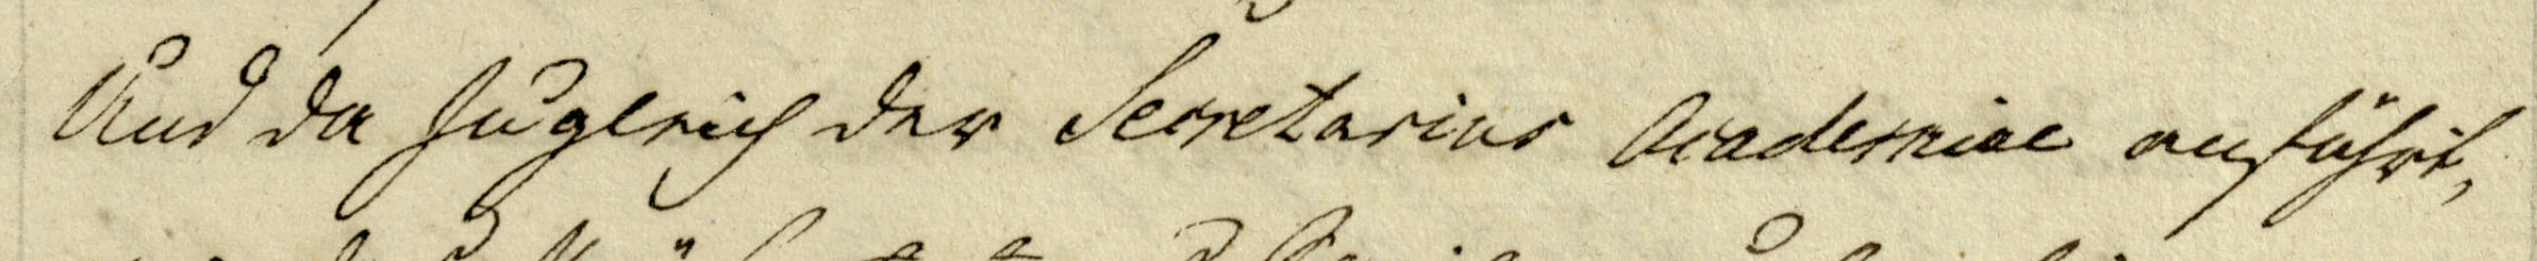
Und da zugleich der Secretarius Academiae anführt,
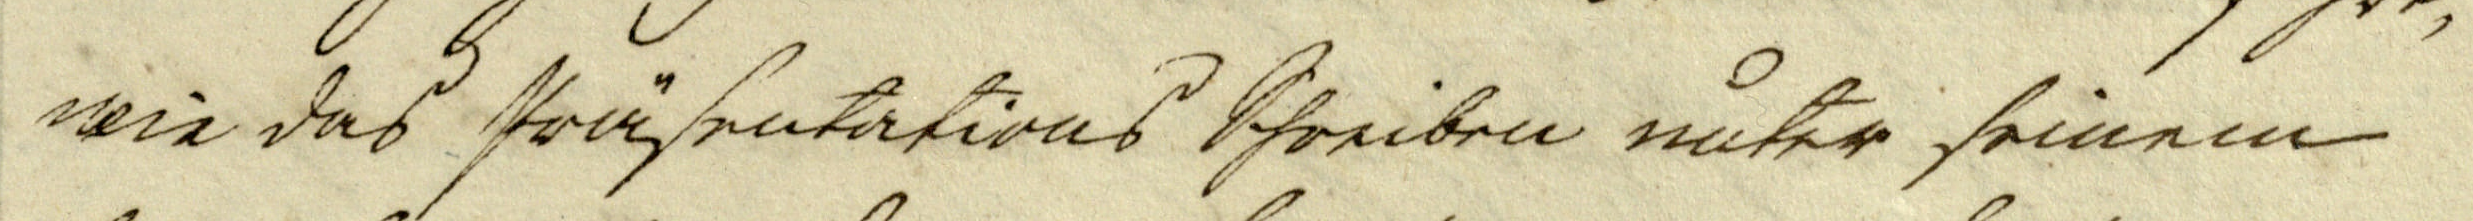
wie das Präsentations Schreiben unter seinem
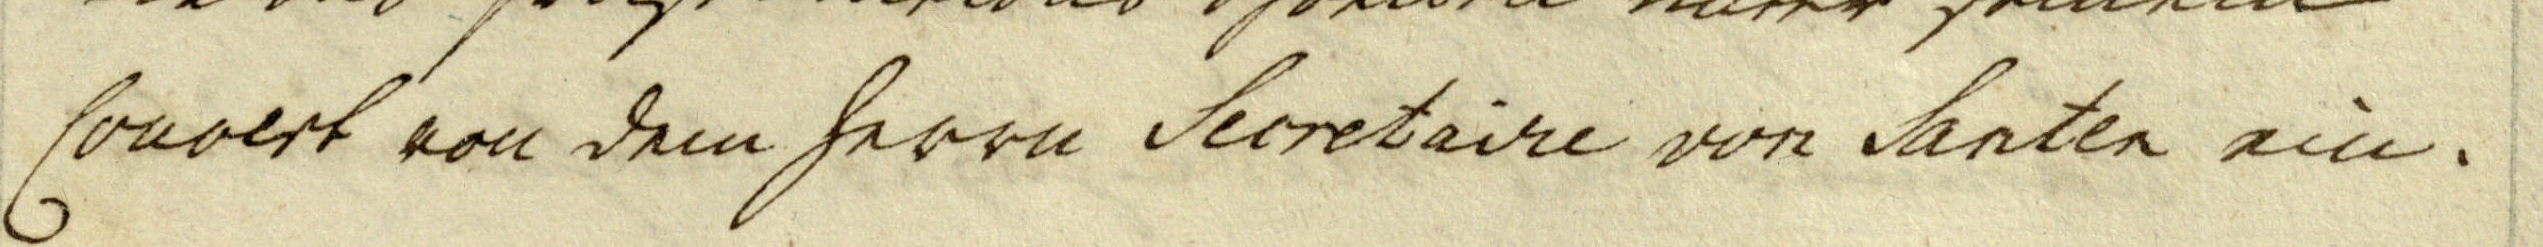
Couvert von dem Herrn Secretaire von Santen ein¬
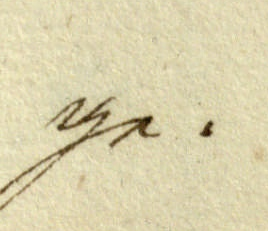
ge¬
